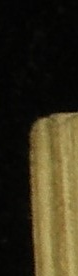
173
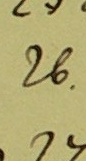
80
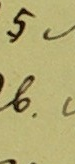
18
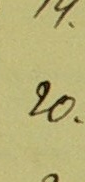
10
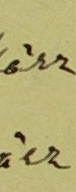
24
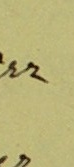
28
